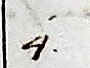4.
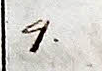4.
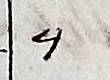4
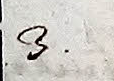3.
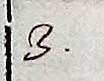3.
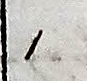1
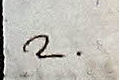2.
